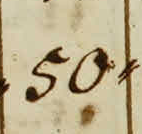50
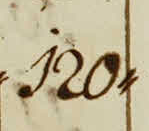120
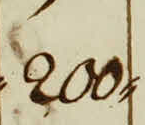200
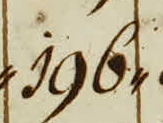196
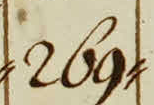269
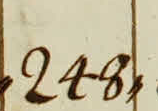248
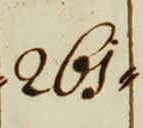261
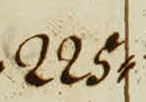225
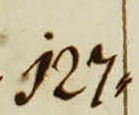127
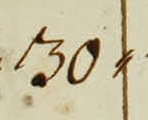30
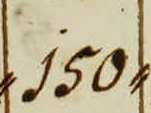150
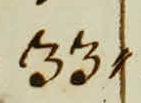33
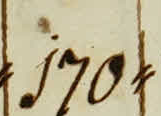170
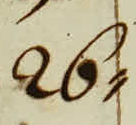26
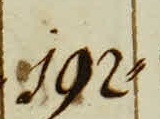192
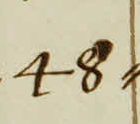48
